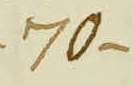70
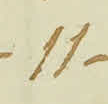11
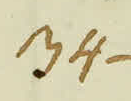34
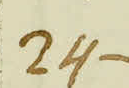24
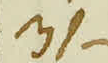31
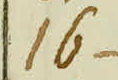16
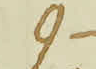9
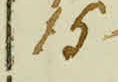15
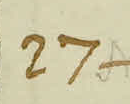27
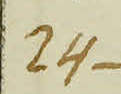24
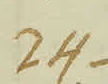24
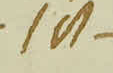18
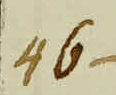46
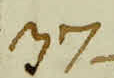37
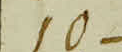10
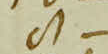8
